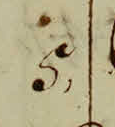5.
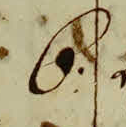6:
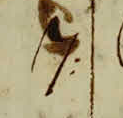7:
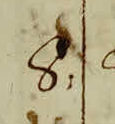8:
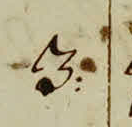3:
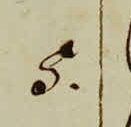5.
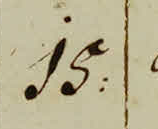15:
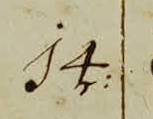14:
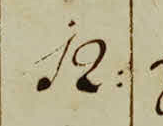12:
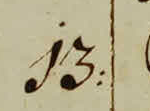13:
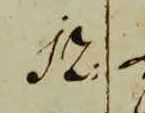12:
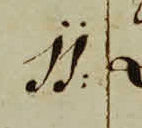11:
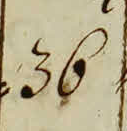36
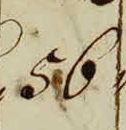56
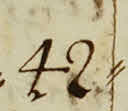42
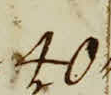40
